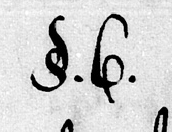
§. 6.
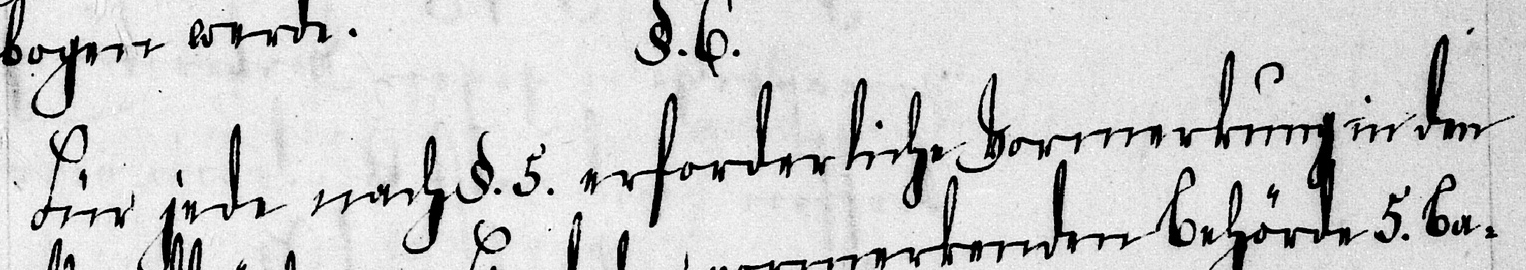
Für jede nach §. 5. erforderliche Vormerkung in der
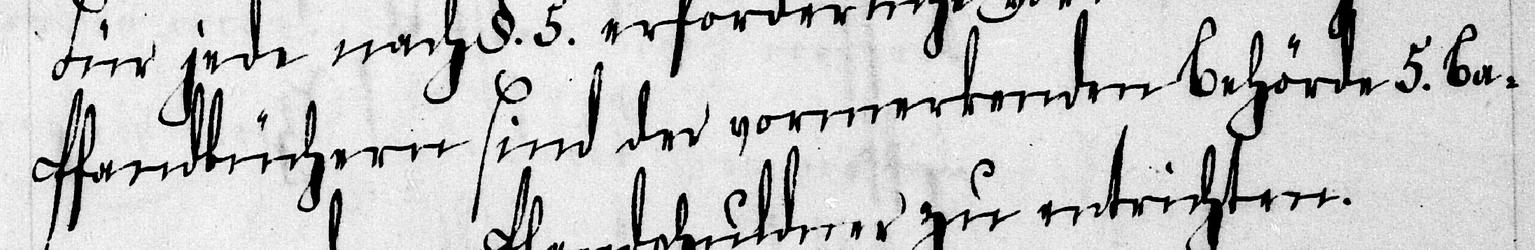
Pfandbüchern sind der vormerkenden Behörde 5. Bat¬
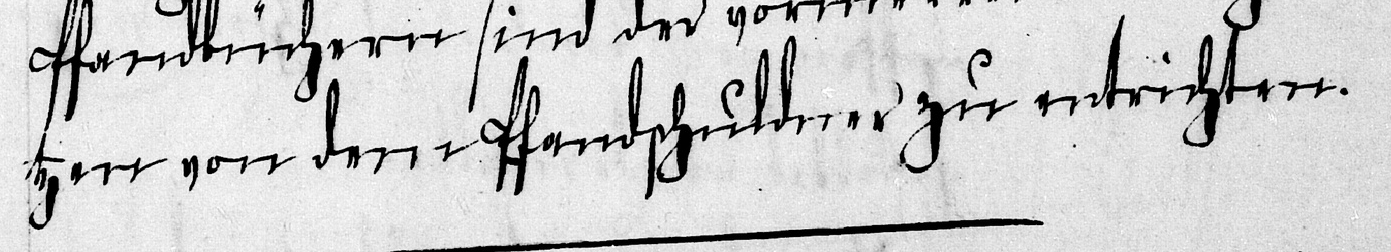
zen von dem Pfandschuldner zu entrichten.
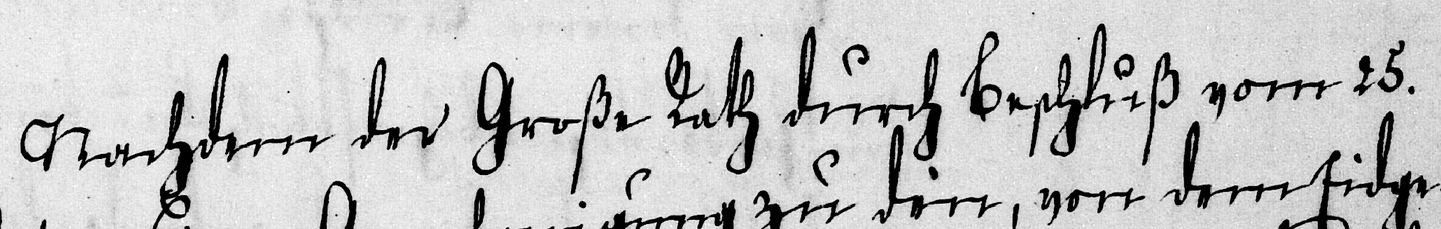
Nachdem der Große Rath durch Beschluß vom 25.
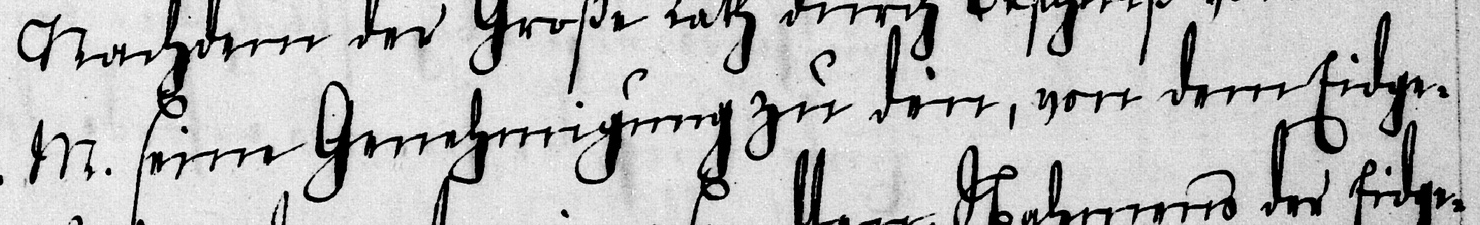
M. seine Genehmigung zu den, von dem Eidgen¬
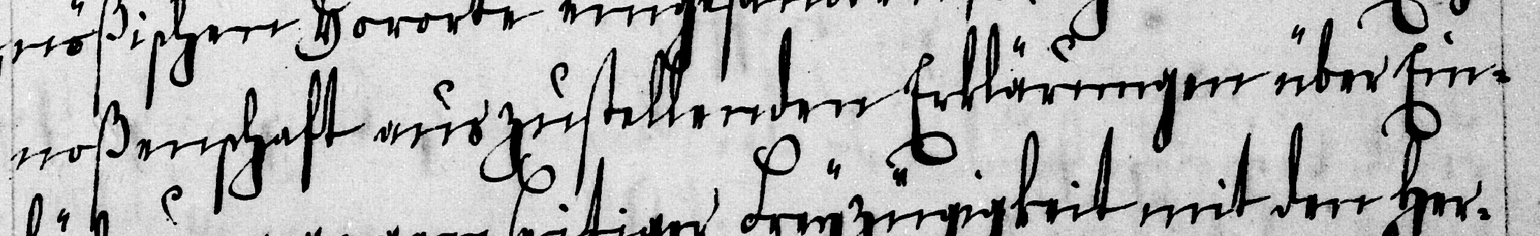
noßenschaft auszustellenden Erklärungen über Ein¬
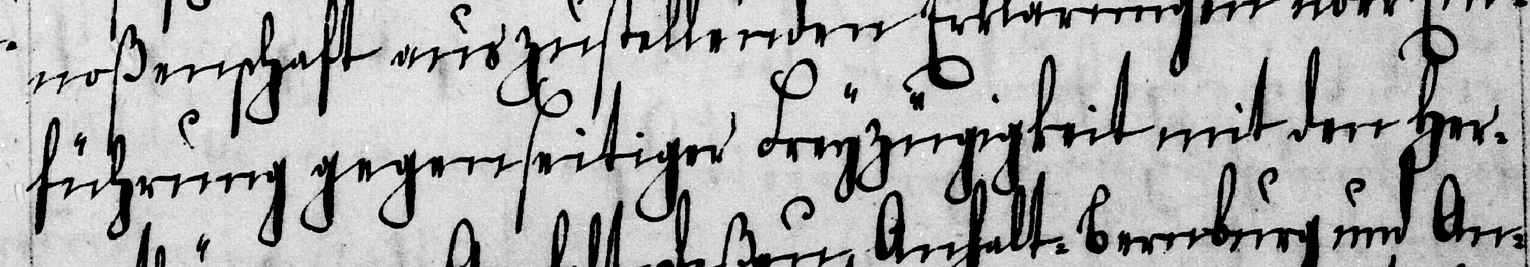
führung gegenseitiger Freyzügigkeit mit den Her¬
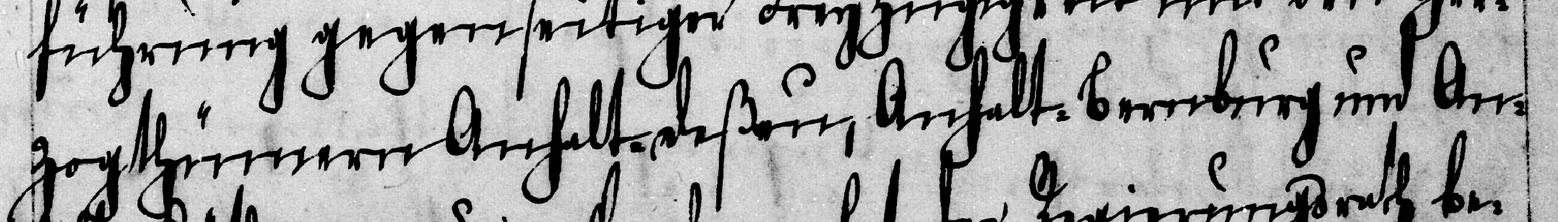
zogthümern Anhalt-Deßau, Anhalt-Bernburg und An¬
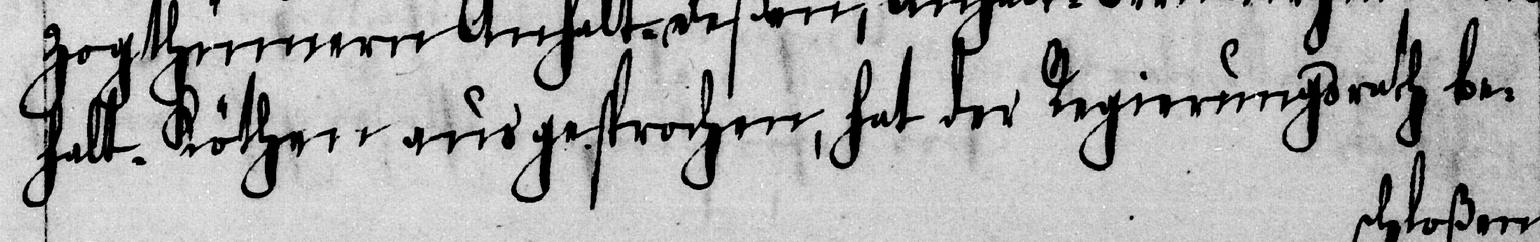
halt-Köthen ausgesprochen, hat der Regierungsrath be-
